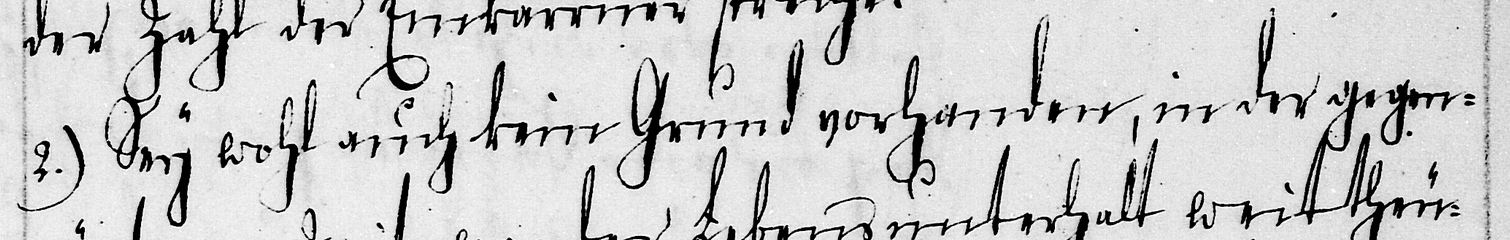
2.) Sey wohl auch kein Grund vorhanden, in der gegen¬
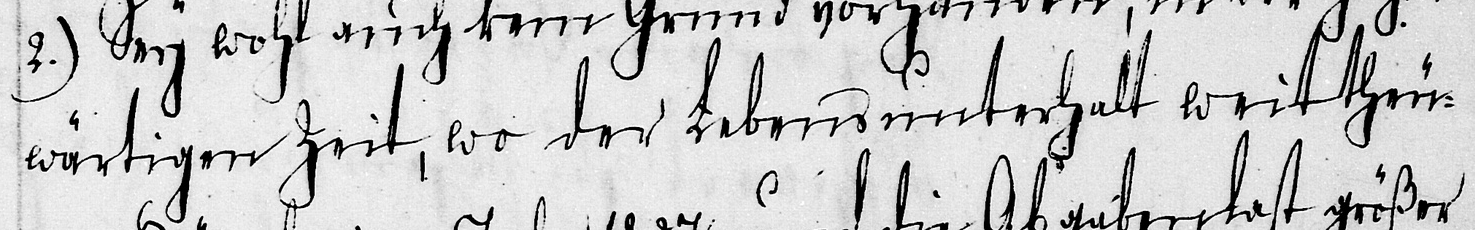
wärtigen Zeit, wo der Lebensunterhalt weit theu¬
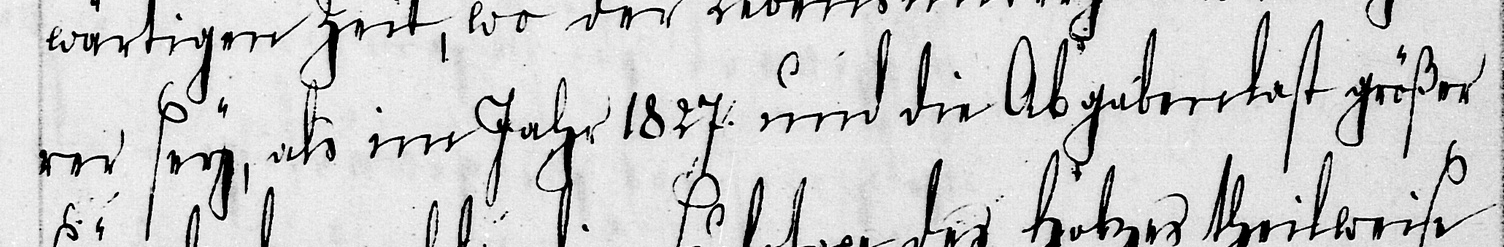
rer sey, als im Jahr 1827. und die Abgabenlast größer
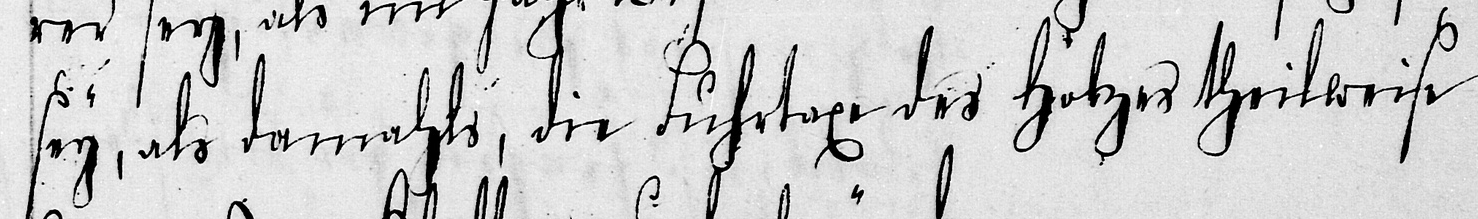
sey, als damahls, die Fuhrtaxe des Holzes theilweise
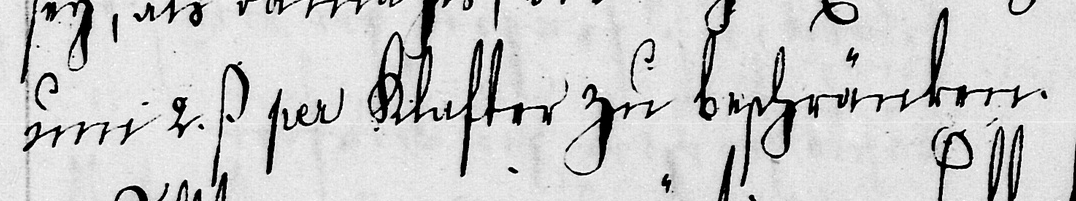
um 2. ß. per Klafter zu beschränken.
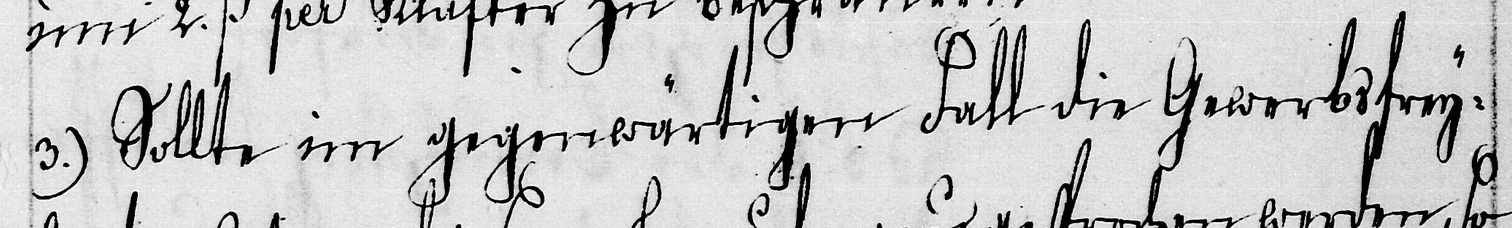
3.) Sollte im gegenwärtigen Fall die Gewerbsfrey¬
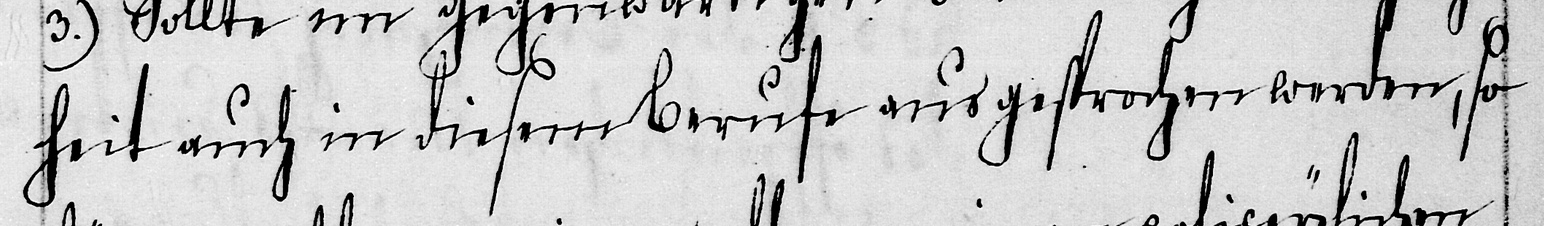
heit auch in diesem Berufe ausgesprochen werden, so
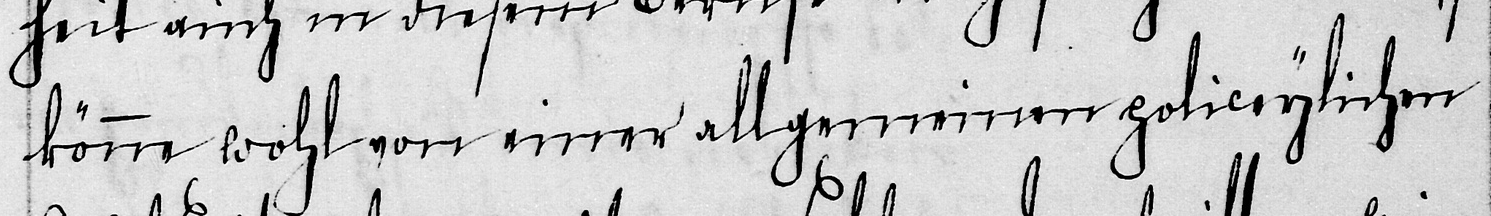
könne wohl von einer allgemeinen policeylichen
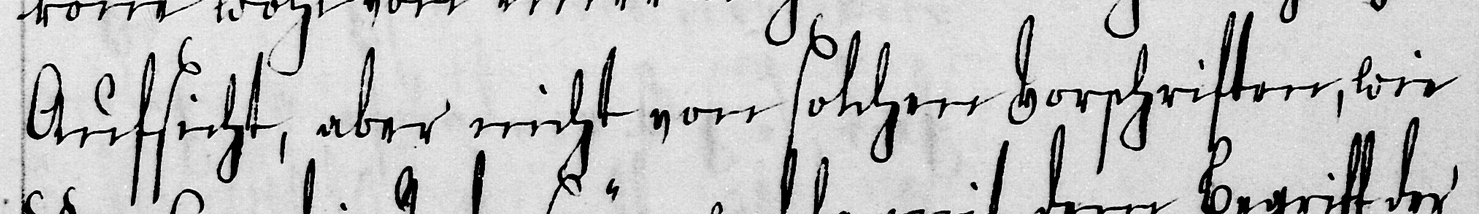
Aufsicht, aber nicht von solchen Vorschriften, wie
